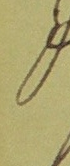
--
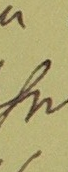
--
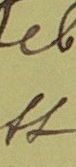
--
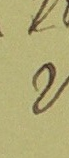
--
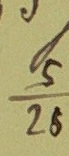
--
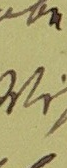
--
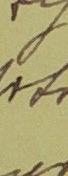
--
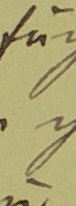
--
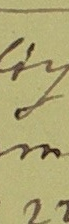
--
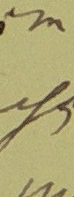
--
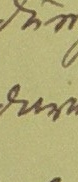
--
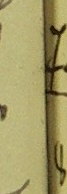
--
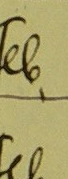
--
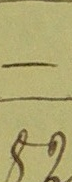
--
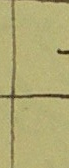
--
